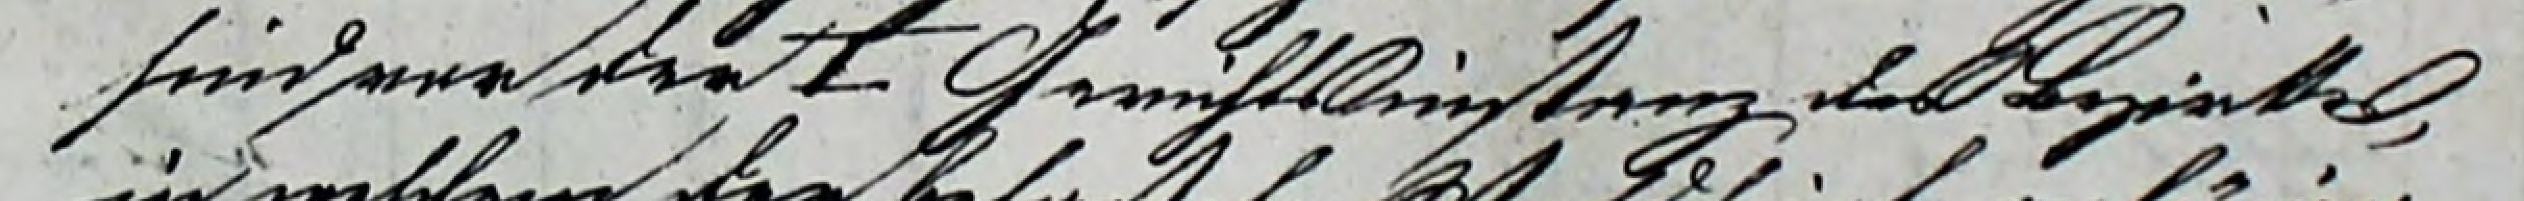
sind vor der I Gerichtsinstanz des Bezirkes,
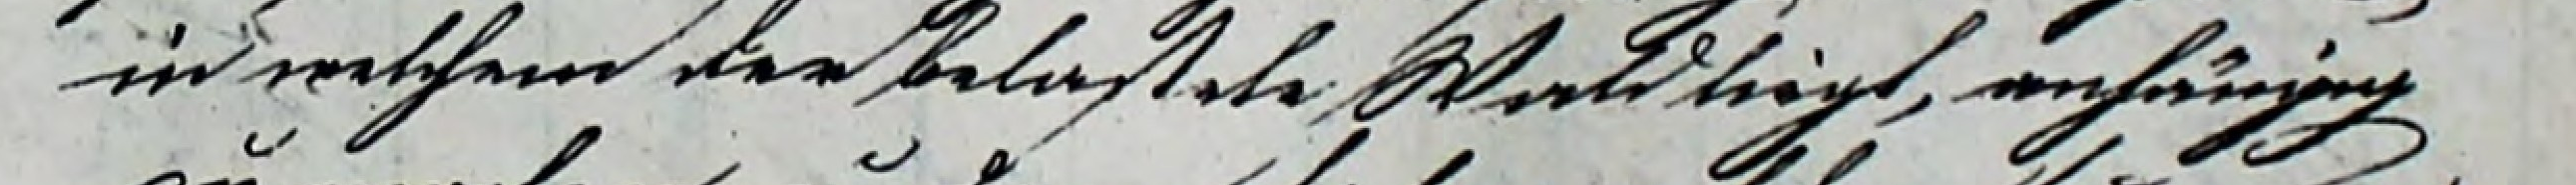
in welchem der belastete Wald liegt, anhängig
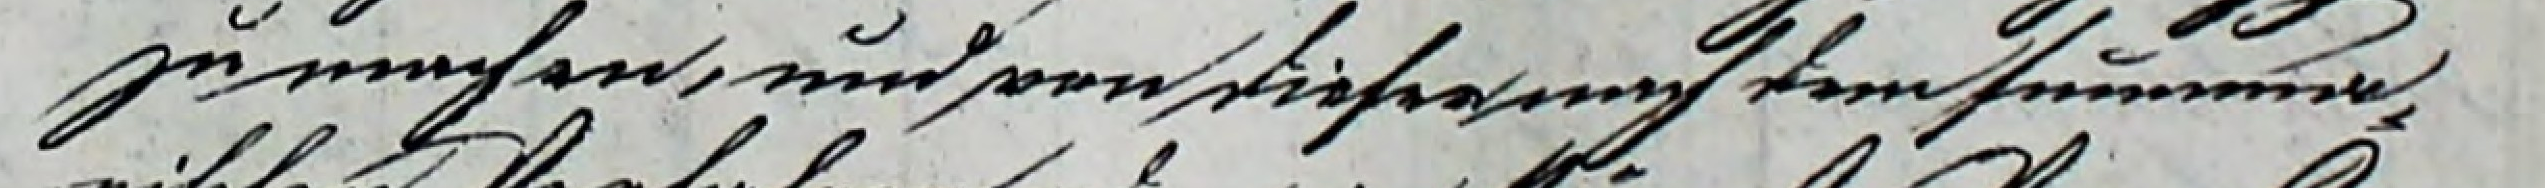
zu machen, und von dieser nach dem summer„
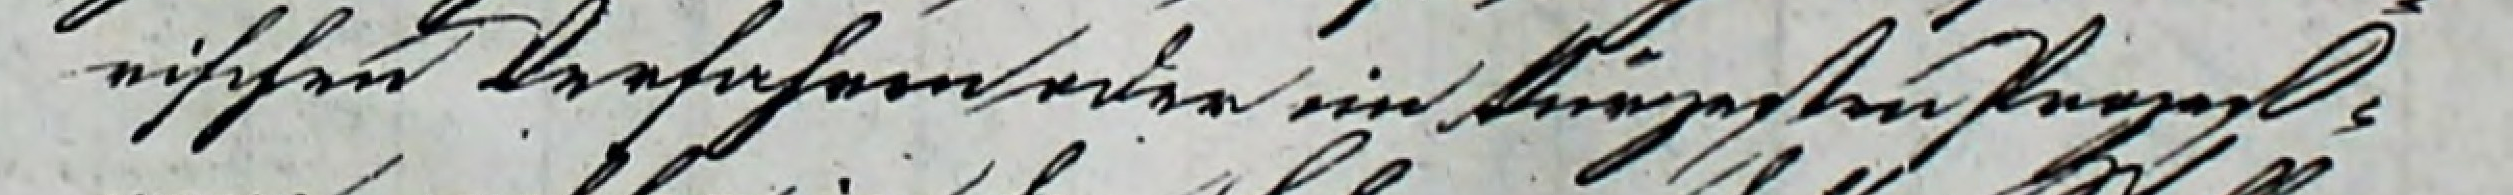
ischen Verfahren oder im kürzesten Prozeß„
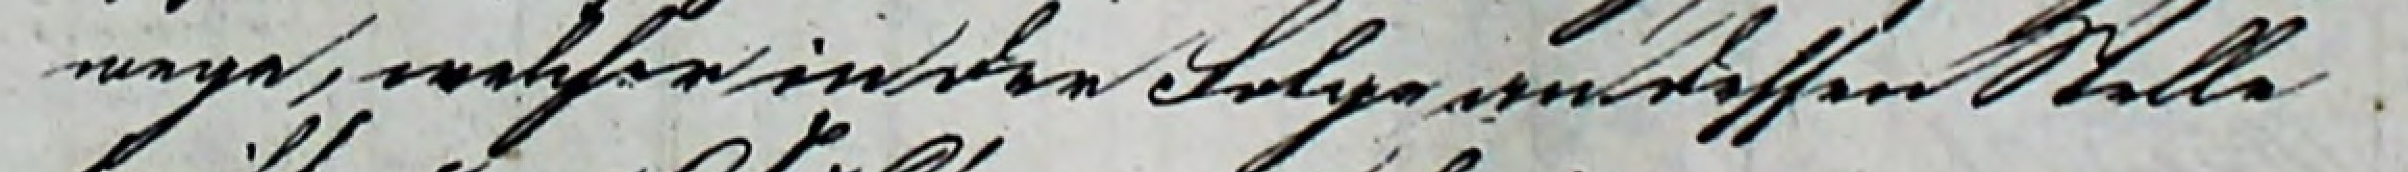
wege, welcher in der Folge an dessen Stelle
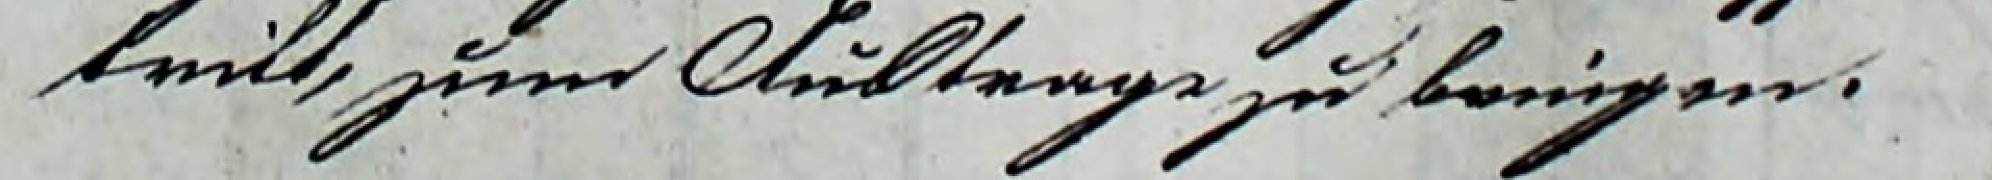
tritt, zum Austrage zu bringen.
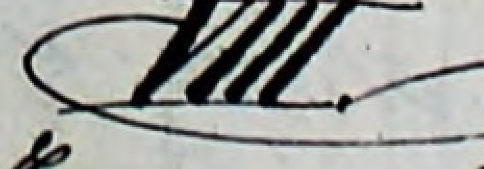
VIII.
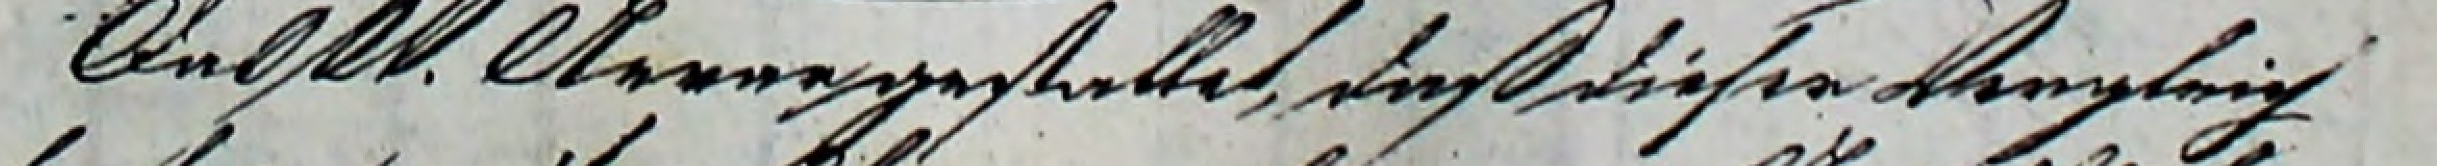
Das kk. Aerar gestattet, daß dieser Vergleich
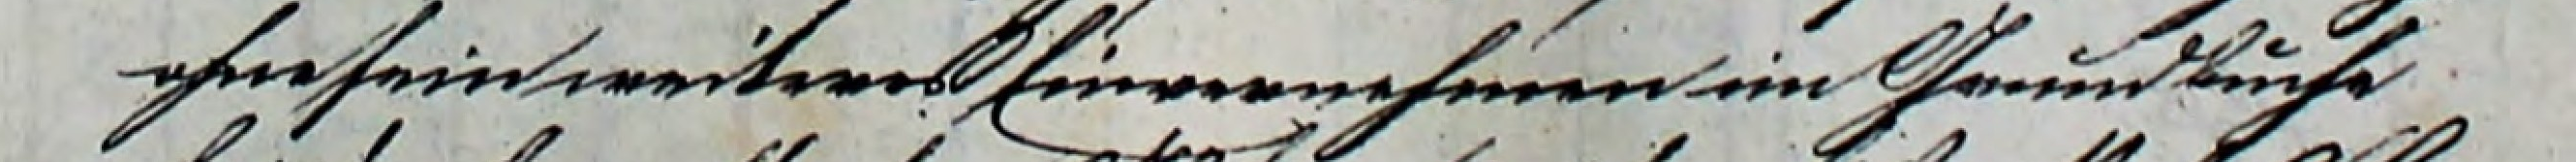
ohne sein weiteres Einvernehmen im Grundbuche
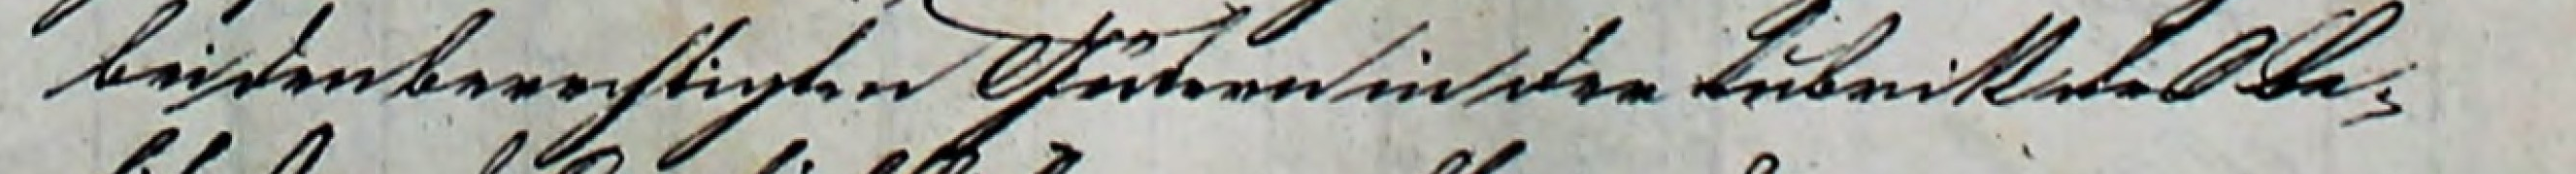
bei den berechtigten Gütern in der Lubrik des Be„
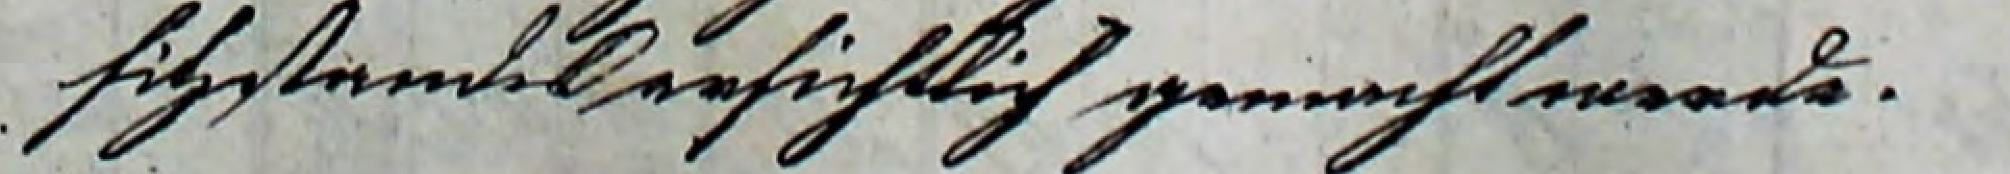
sitzstandes ersichtlich gemacht werde.
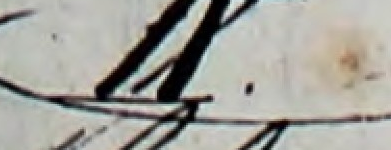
IX.
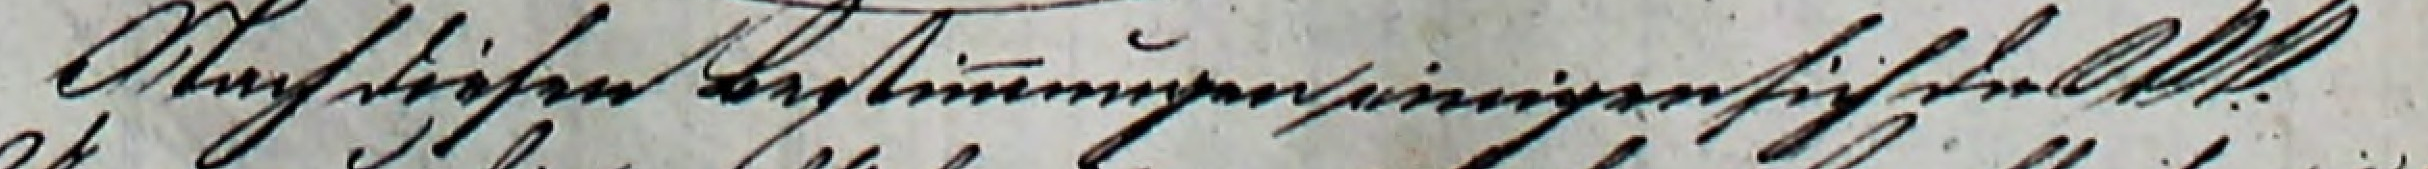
Nach diesen Bestimmungen einigen sich das kk.
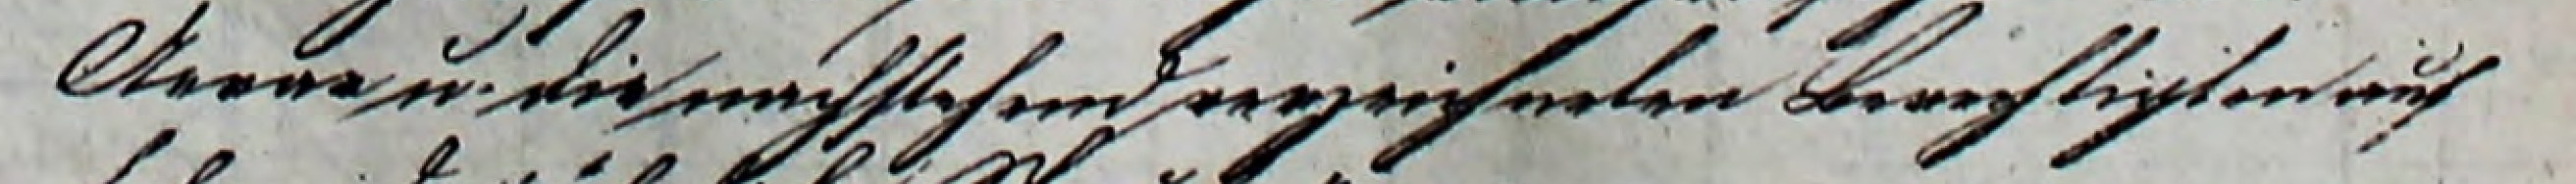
Aerar u. die nachstehend verzeichneten Berechtigten auf
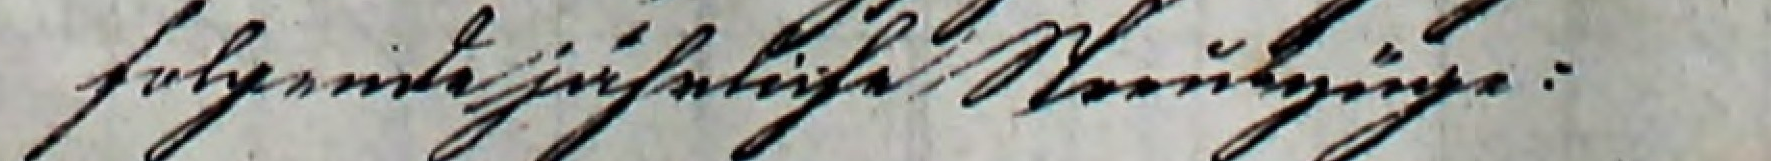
folgende jährliche Streubezüge:
